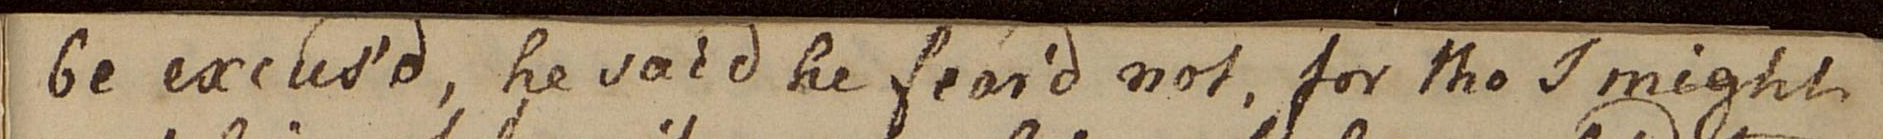be excus'd, he said he fear'd not, for tho I might
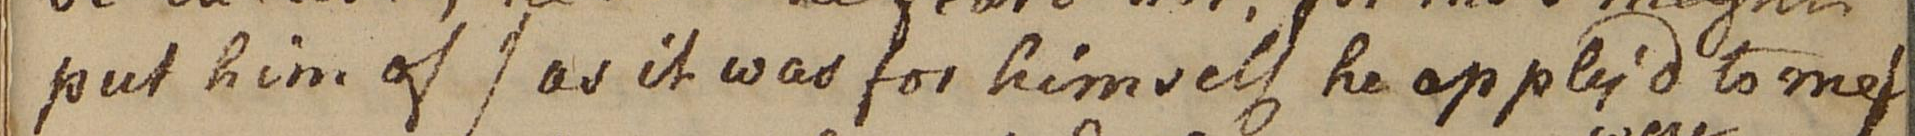put him of /as it was for himself he apply'd to me/
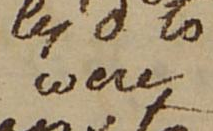were
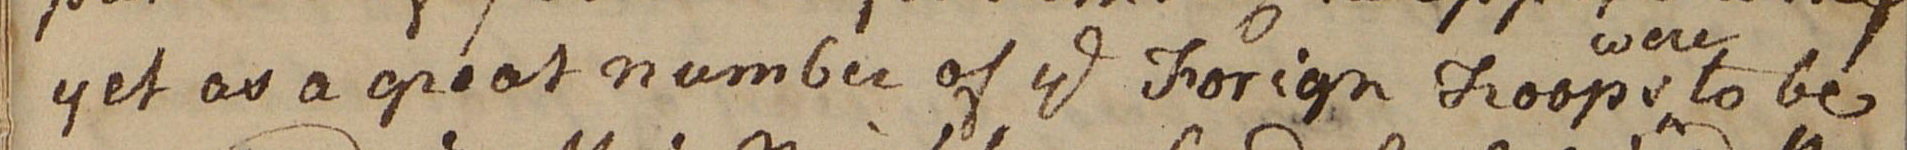yet as a great number of y^e Forign Troops ^ to be
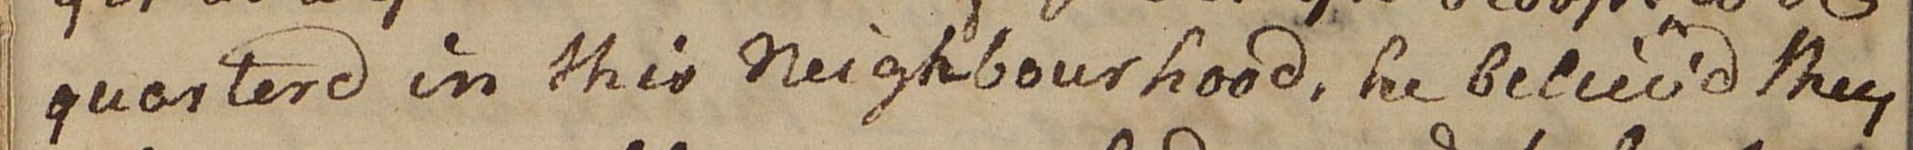quarterd in this Neighbourhood, he believ'd they
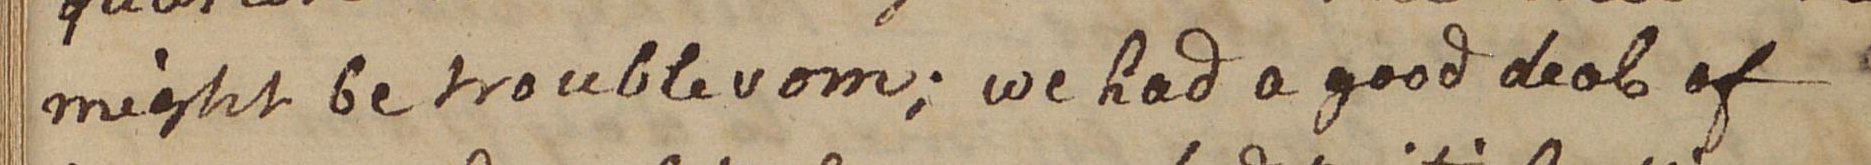might be troublesom; we had a good deal of
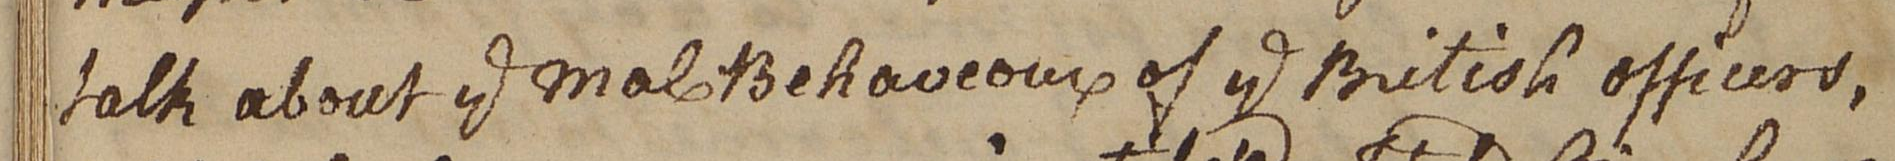talk about y^e mal Behaveour of y^e British officers,
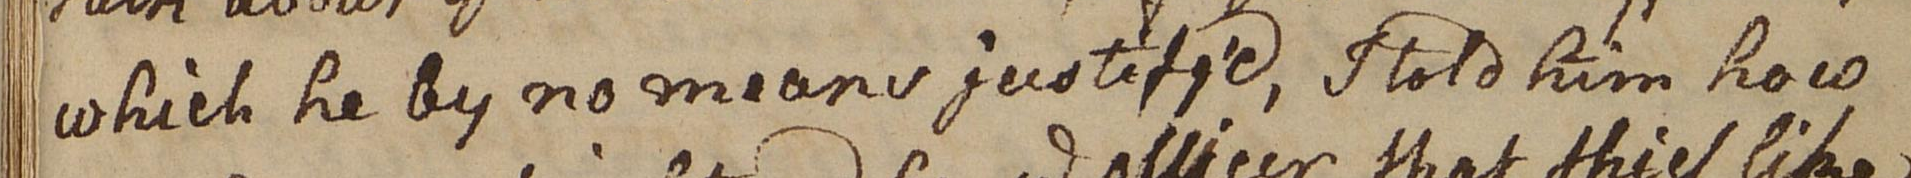which he by no means justefy'd, I told him how
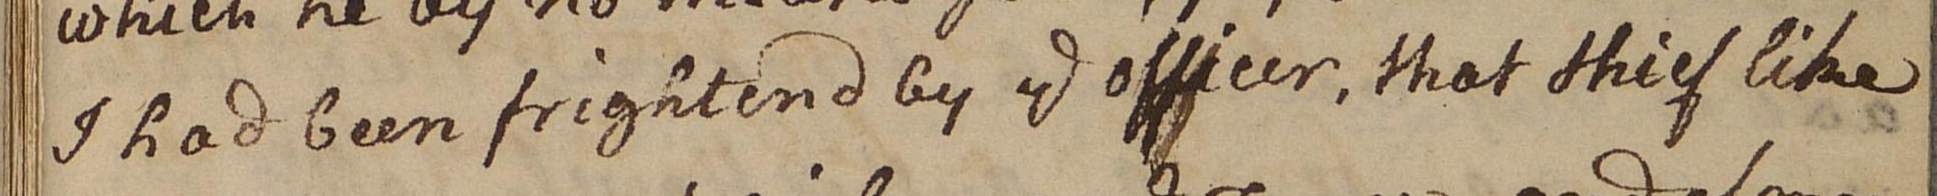I had been frightend by y^e officer, that thief like
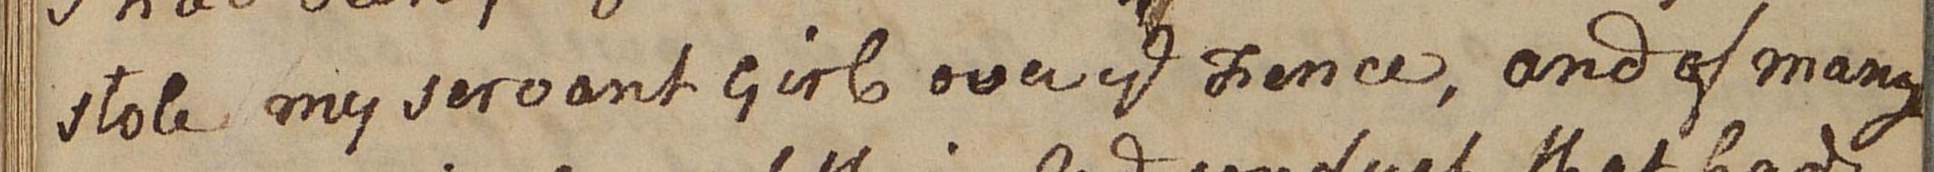stole my servant Girl over y^e Fence, and of many
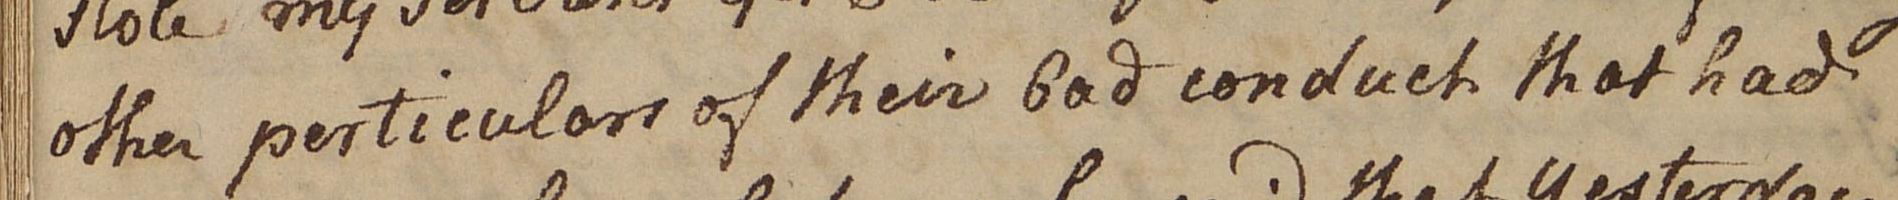other perticulars of their bad conduct that had
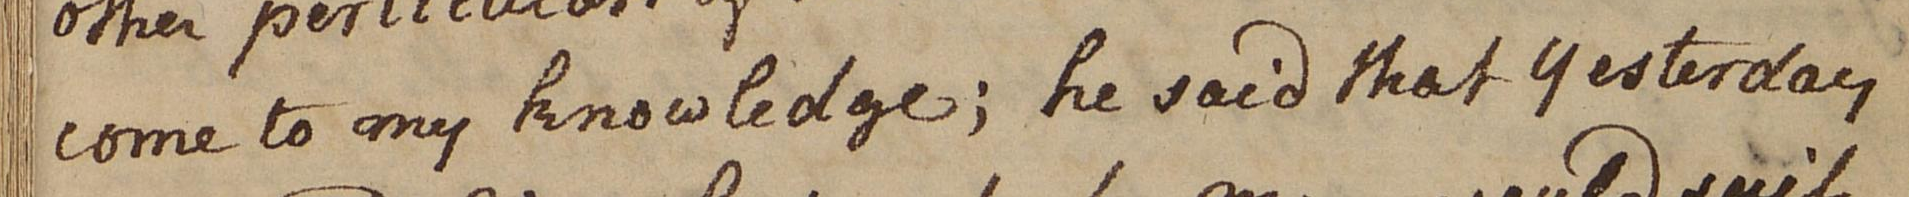come to my knowledge; he said that Yesterday
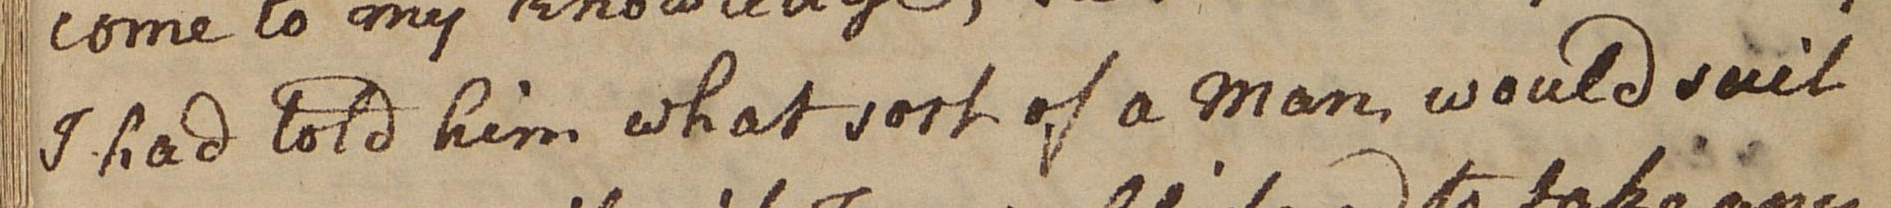I had told him what sort of a man, would sail
